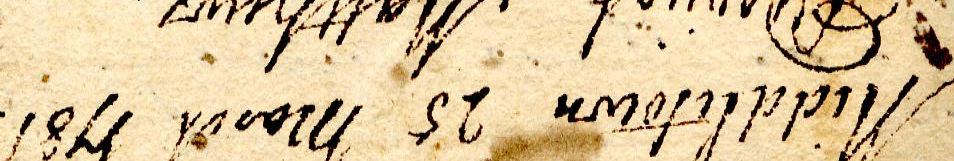Middetown 25 March 1781
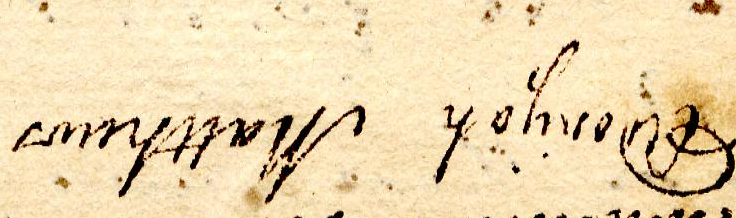Adonijah Matthews
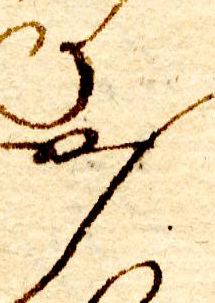To
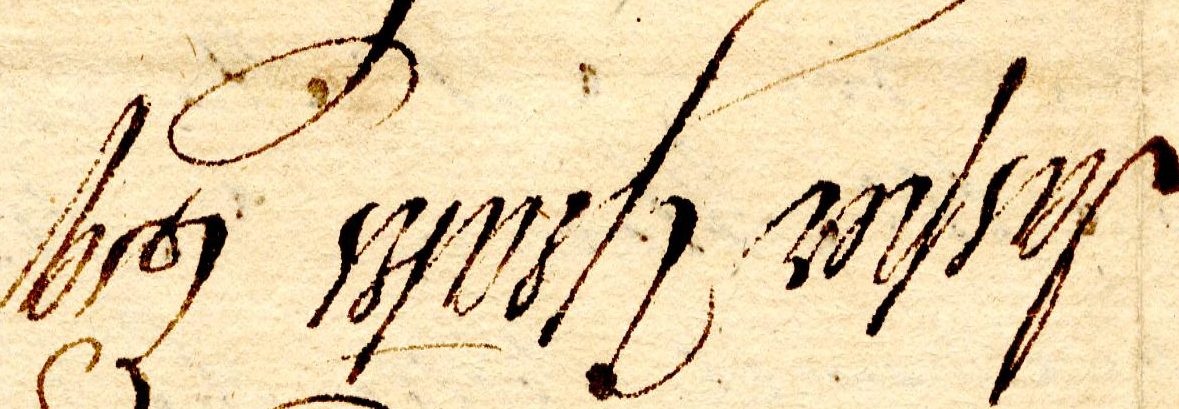Jasper Yeates Esq
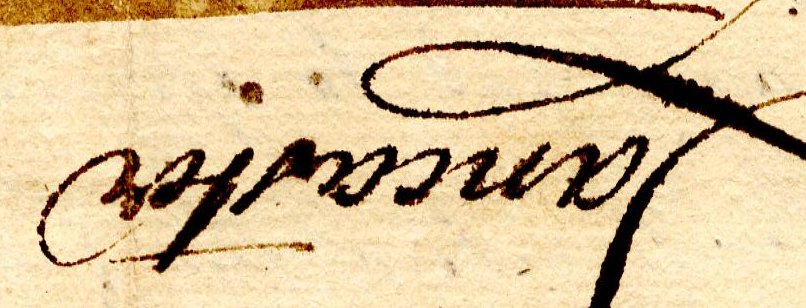Lancaster
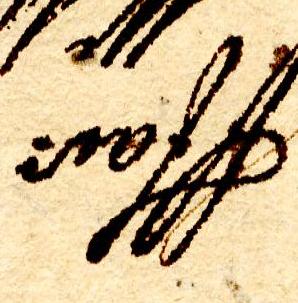Per fav.
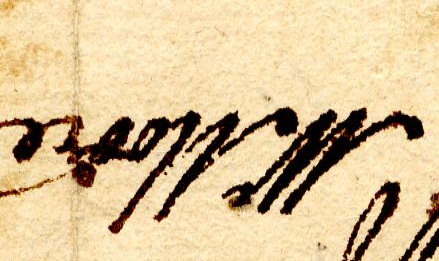M^r. Moore
